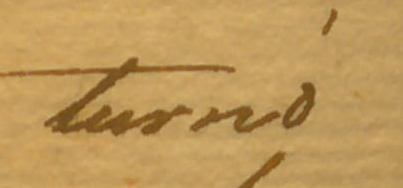turn'd
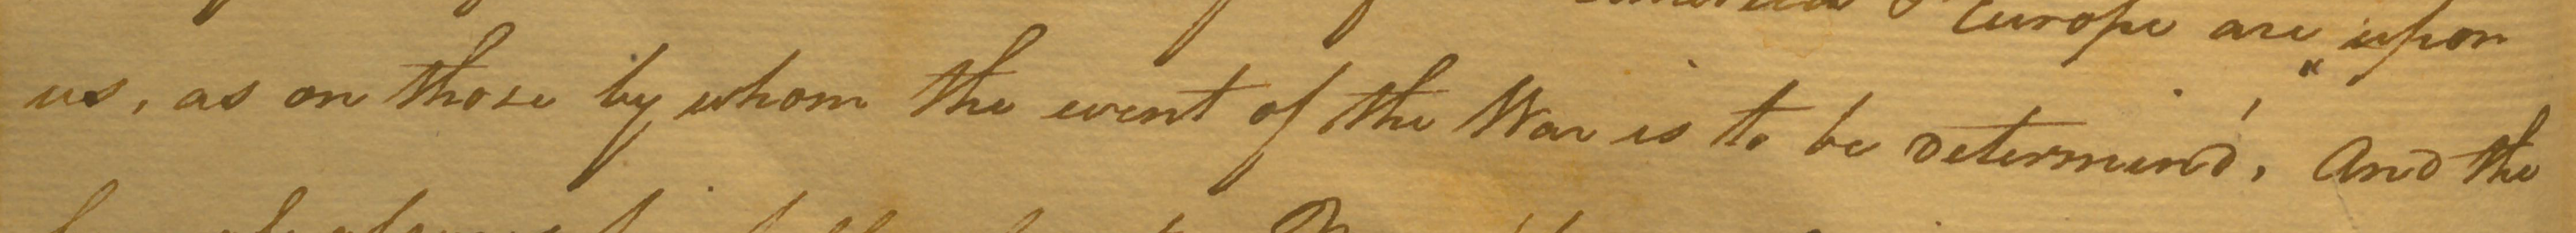us, as on those by whom the event of the War is to be determin'd. And the
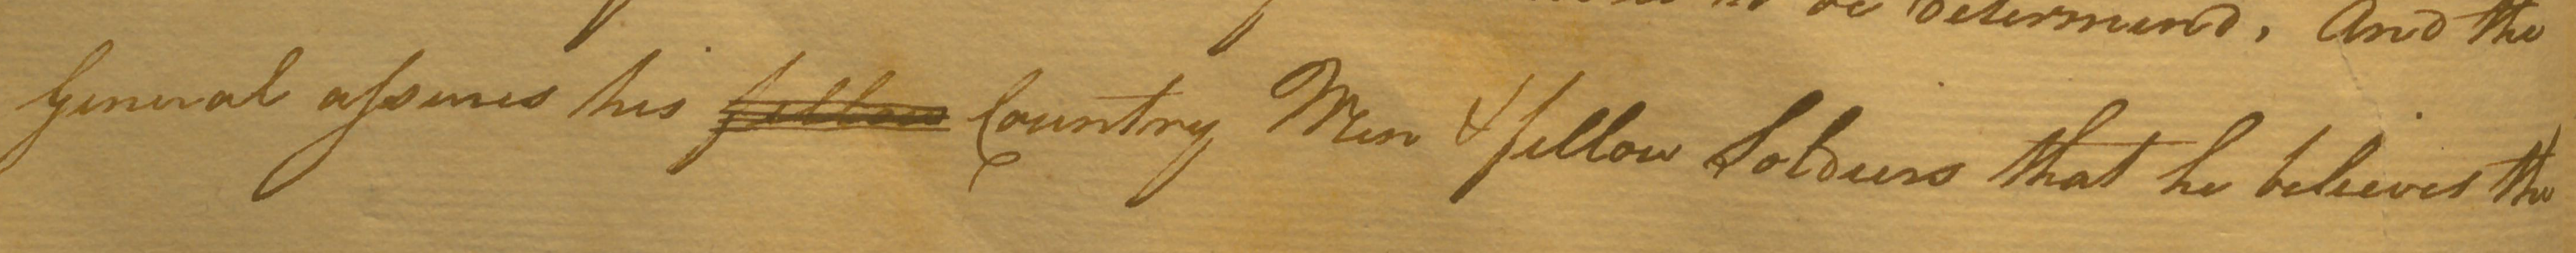General assures his [______] Country Men & fellow Soldiers that he believed the
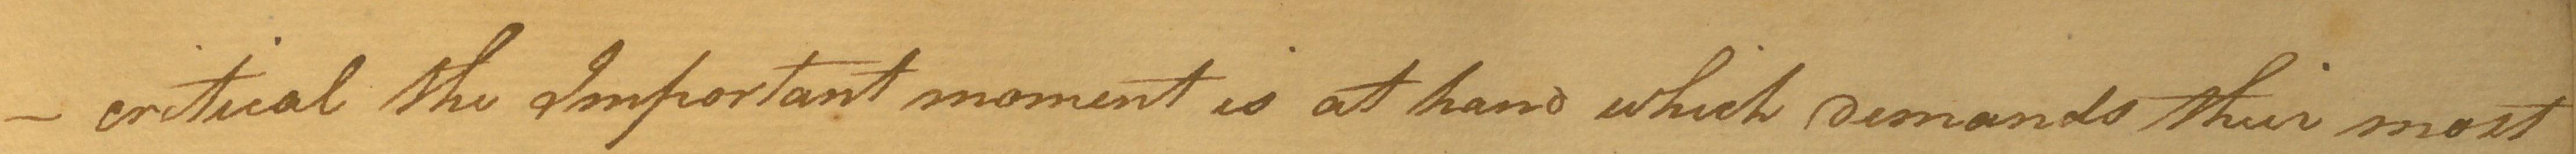- critical the Important moment is at hand which demands their most
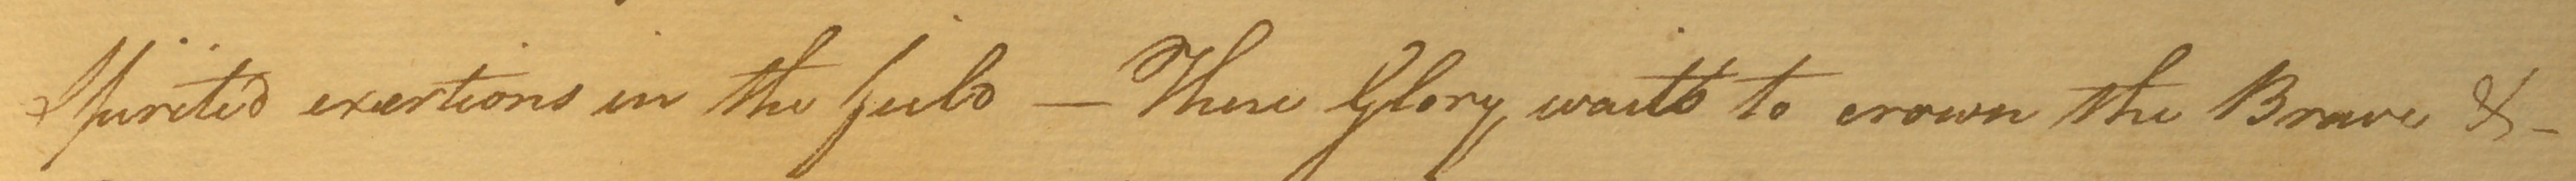Spirited exertions in the field- There Glory waits to crown the Brave &
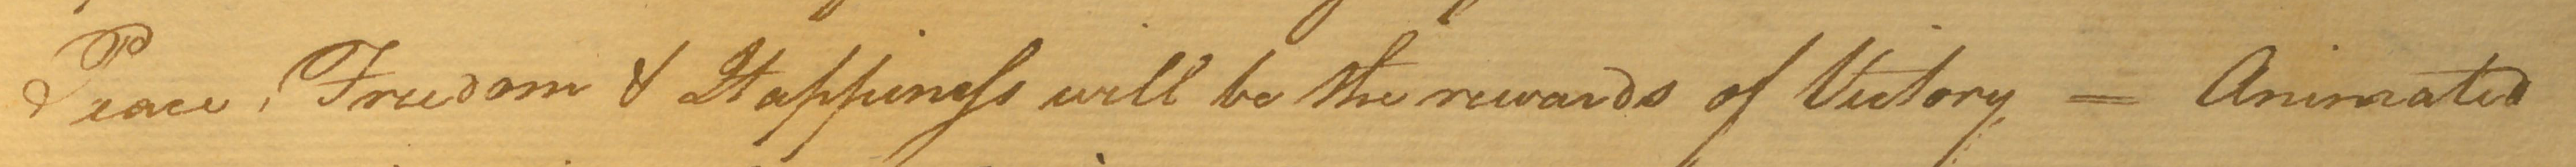Peace, Freedom & Happiness will be the rewards of Victory- Animated
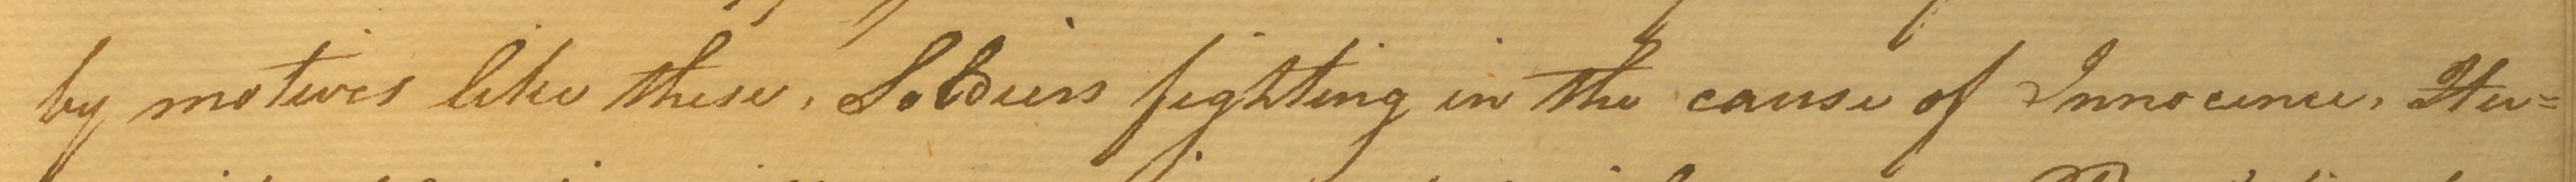by motives like these, Soldiers fighting in the cause of Innocence, Hu-
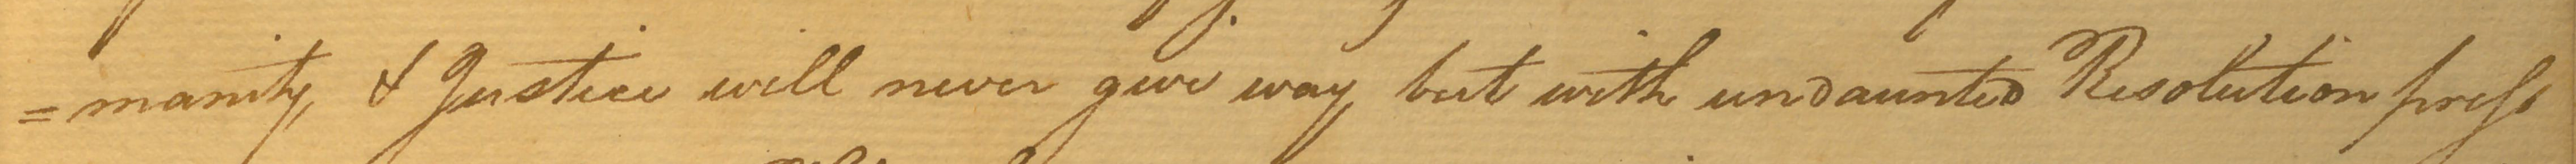-manity, & Justice will never give way but with undaunted Resolution press
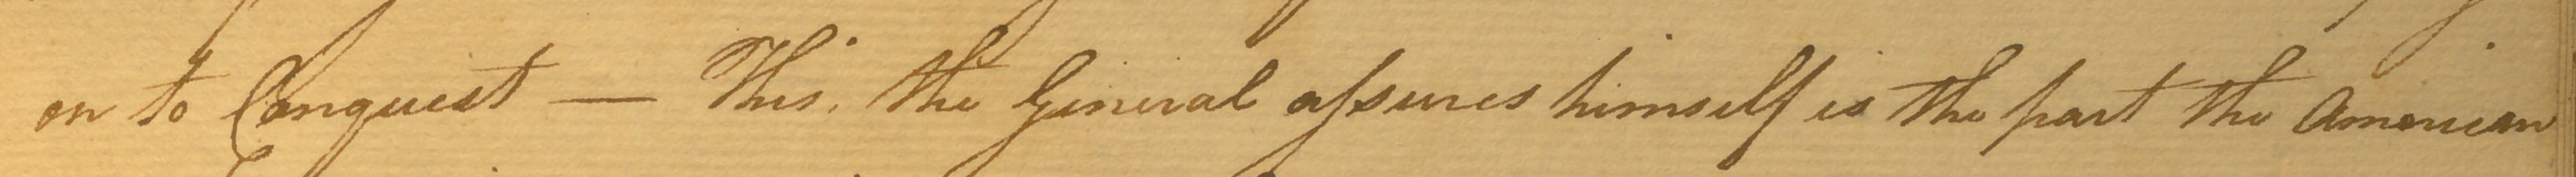on to Conquest- This the General assures himself is the part the American
